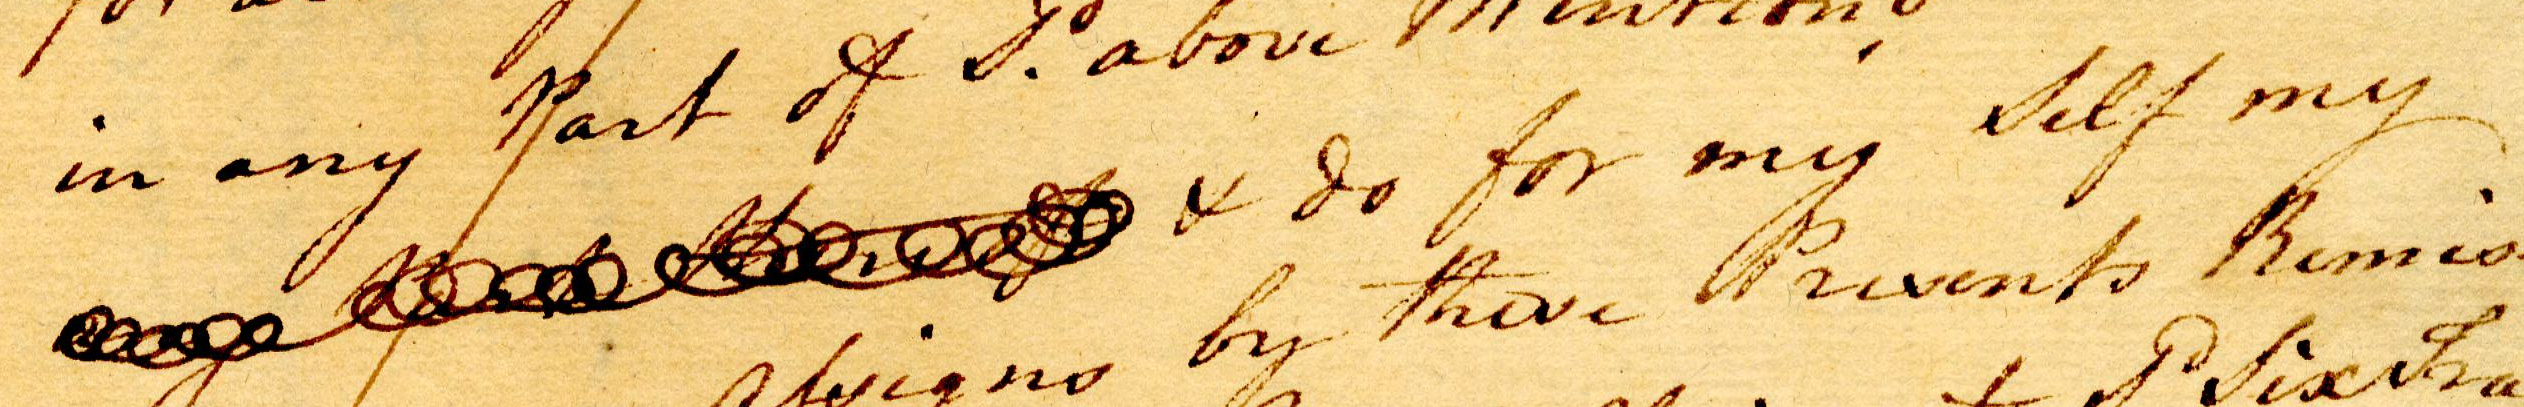[______________] & do for my self my
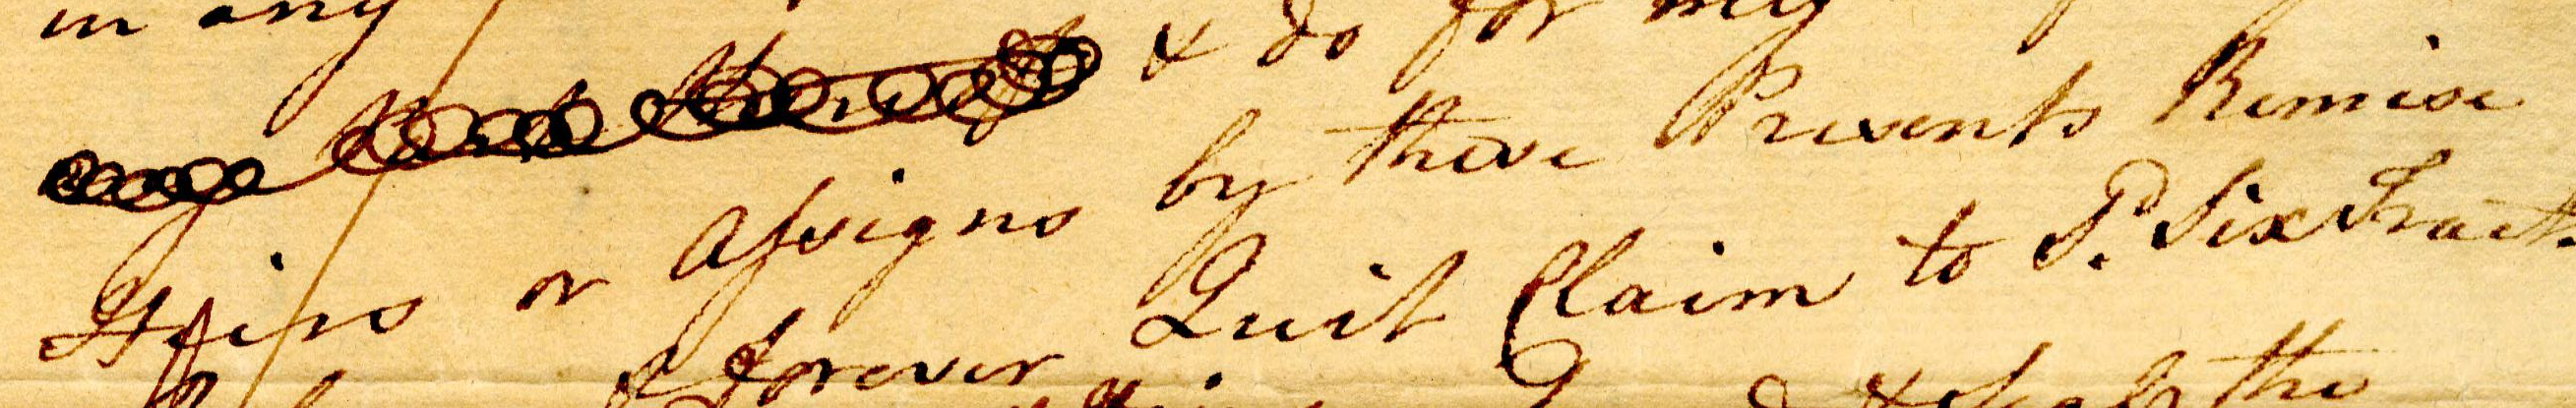Heirs or Assigns by these Prevents Remise
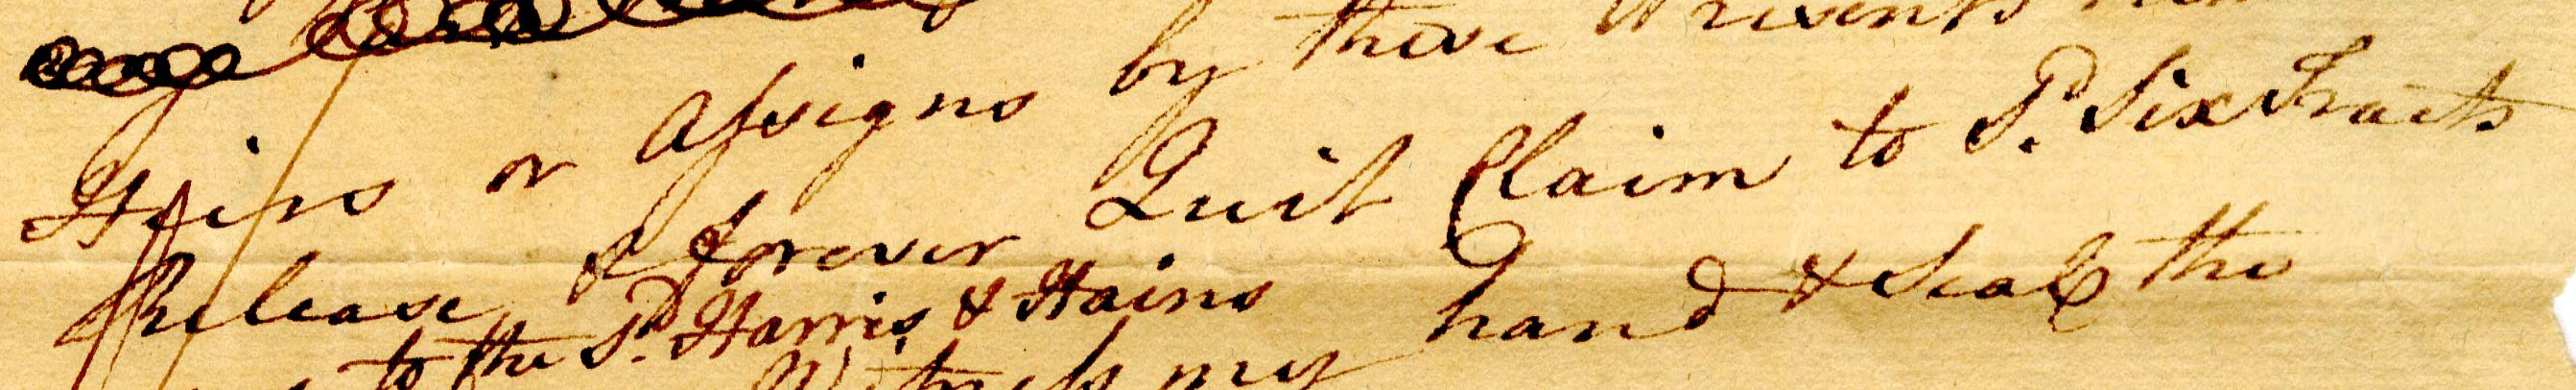Release & forever Quit Claim to s^d. six Tracts
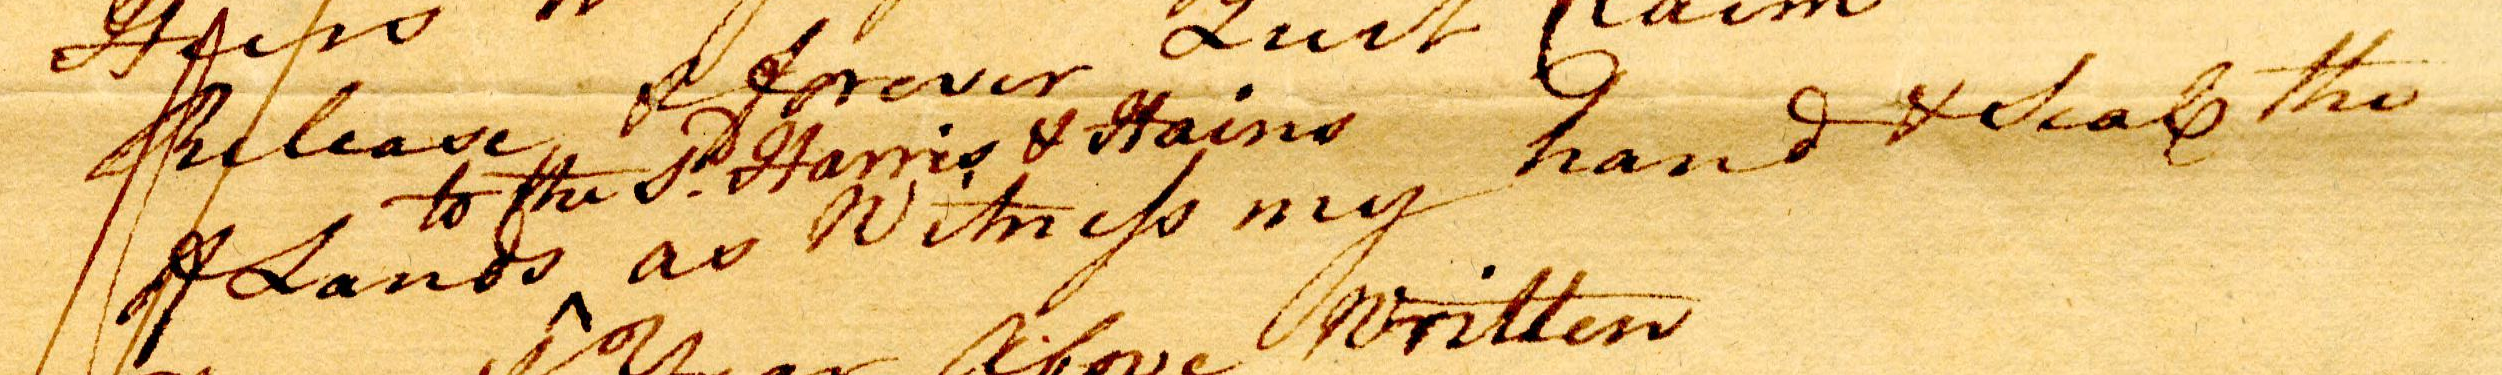of Lands ^ as withness myhand & scab the
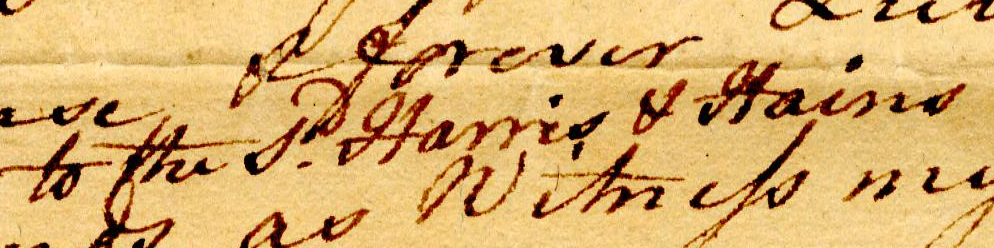to the s^d. Harris & Hains
